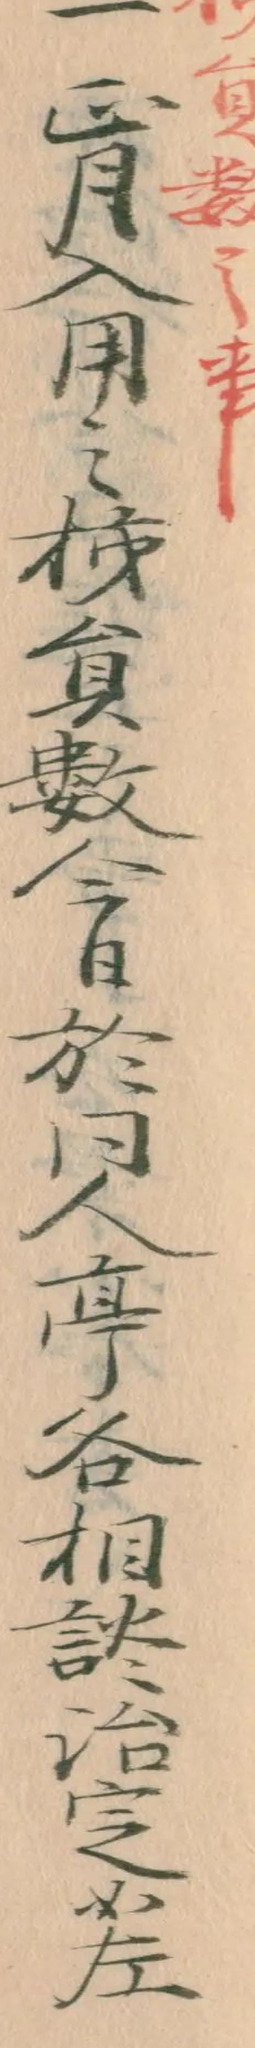一正月入用之柿員数今日於同人亭各相談治定如左
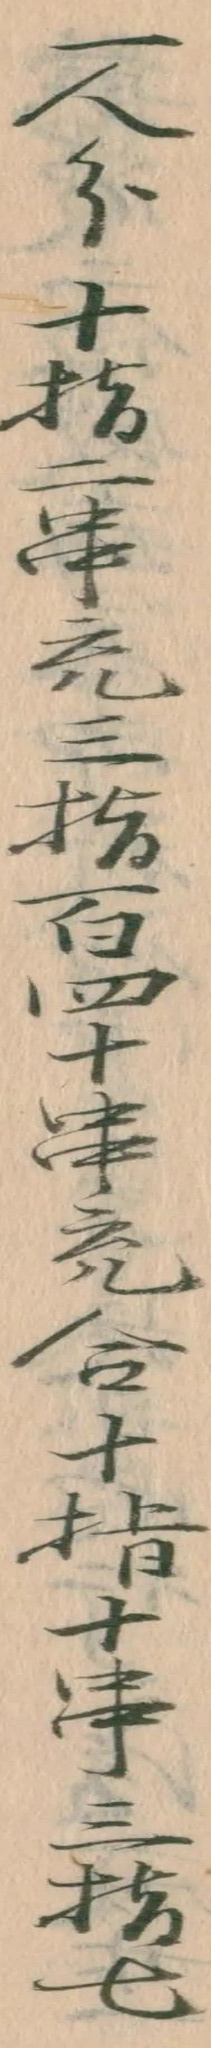一人分十指二串充三指百四十串充合十指十串三指七
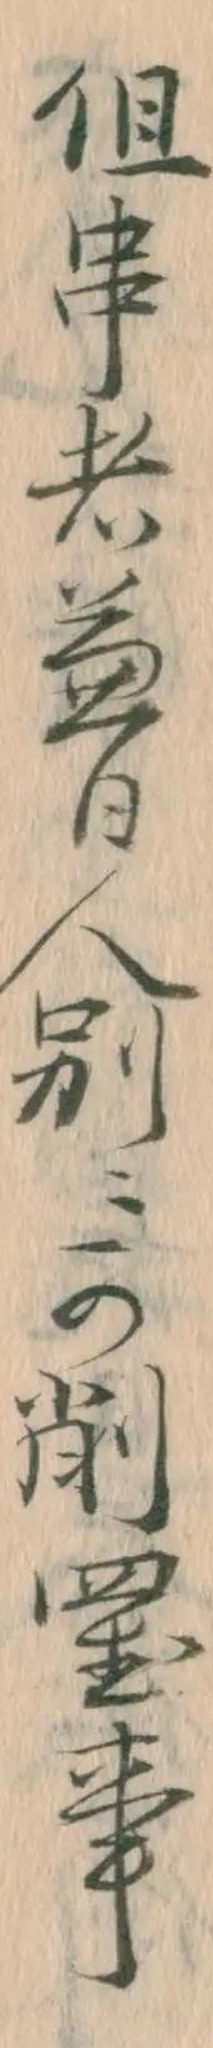但串者兼日人別ニ可削置事
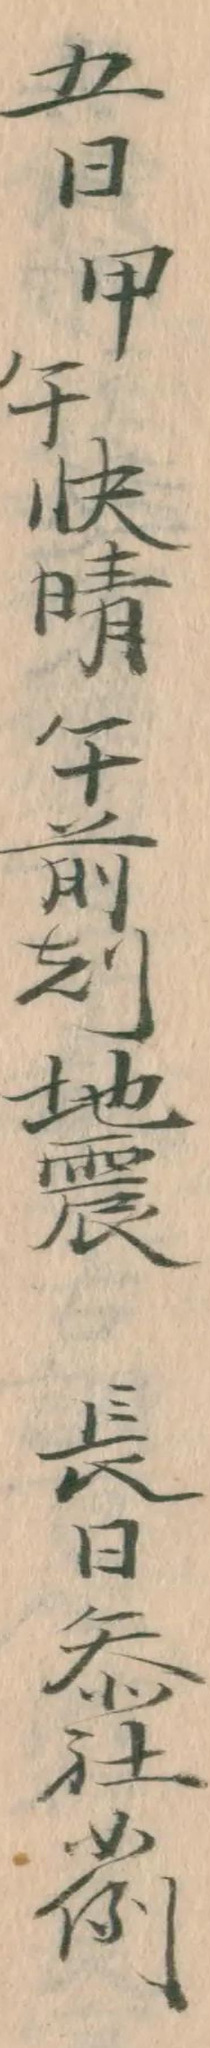五日甲午快晴午前刻地震長日参社如例
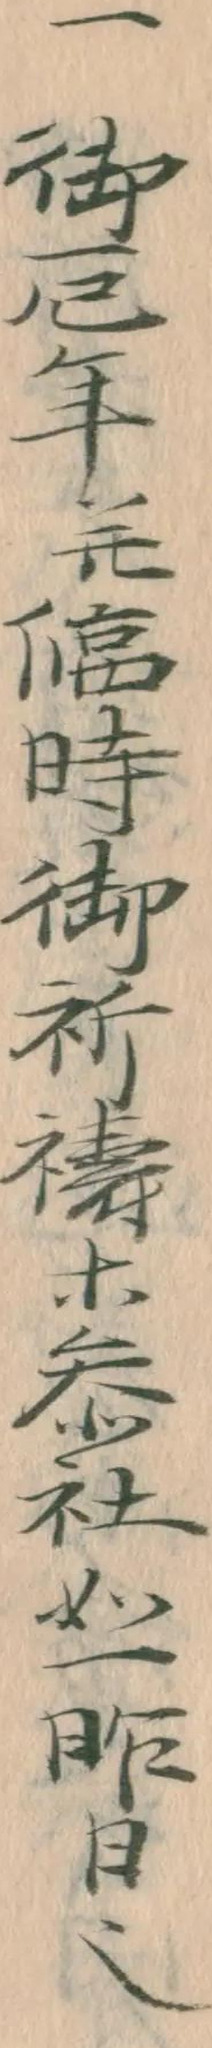一御厄年幷臨時御祈祷等参社如一昨日也
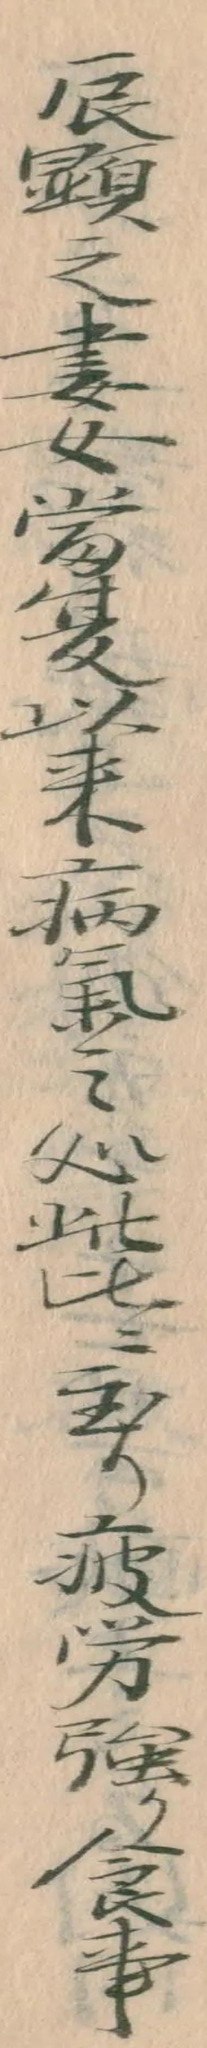一辰顕之妻女當夏以来病氣之処此比ニ至リ疲労強ク食事
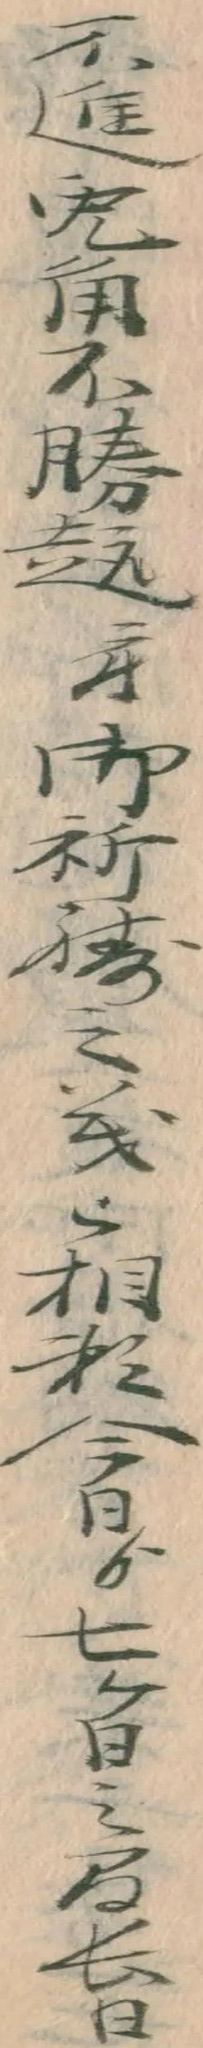不進兎角不勝趣ニ付御祈祷之義被相頼今日ゟ七ケ日之間長日
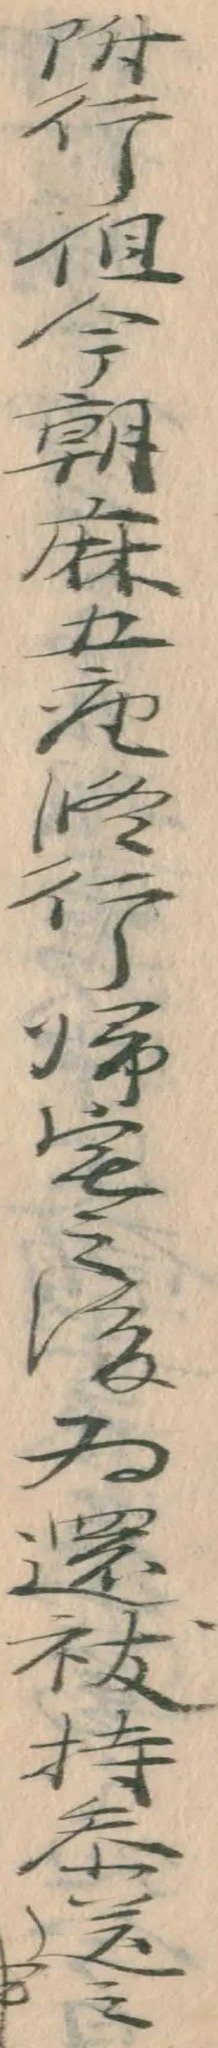附行但今朝麻五座修行帰宅之後為還祓持参送之事
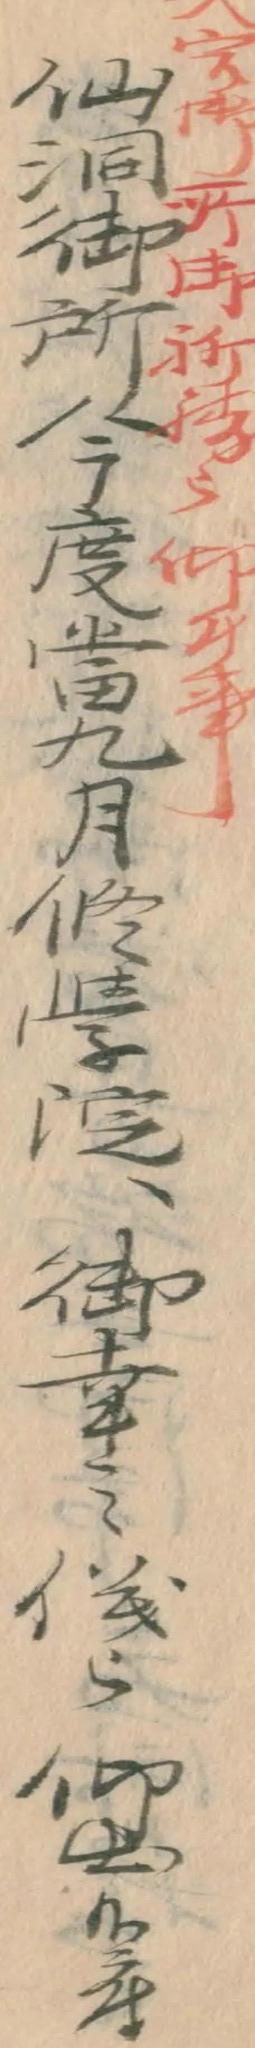一仙洞御所今度當九月修学院へ御幸之儀被仰出候ニ付

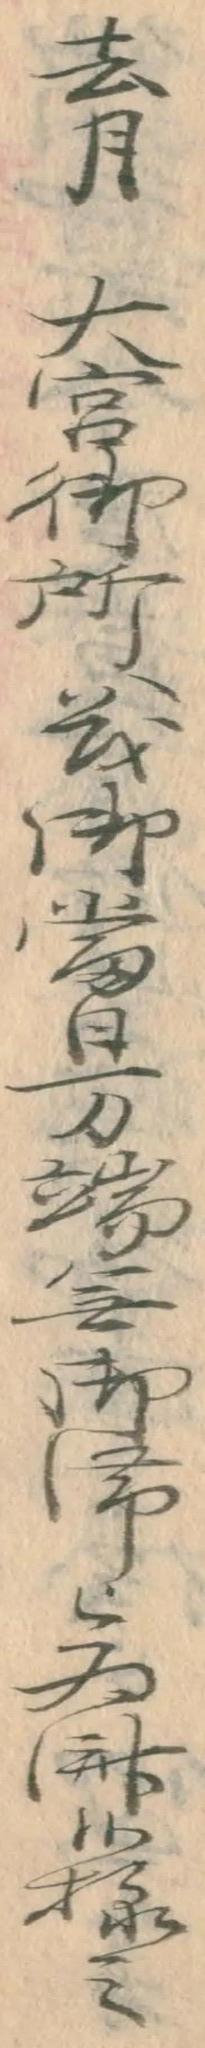去月大宮御所へも御當日万端無御滞被為済候様之
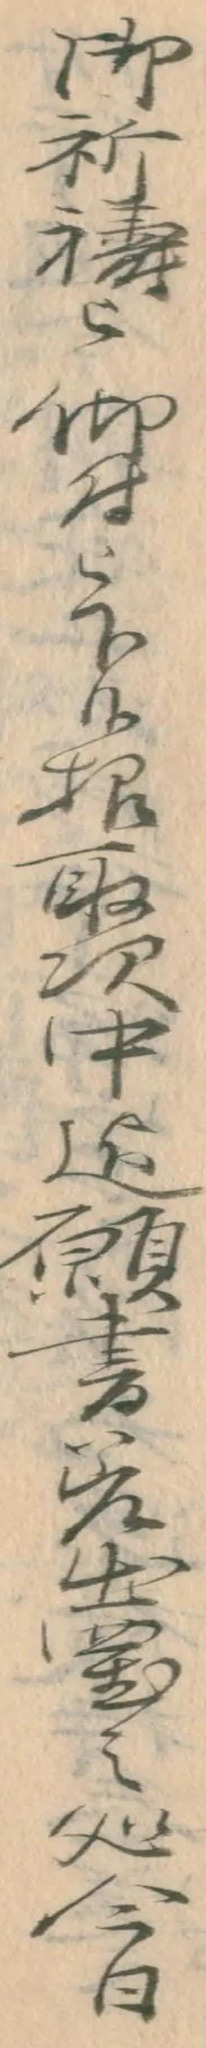御祈祷被仰付被下候様取次中迄願書差出置之処今日
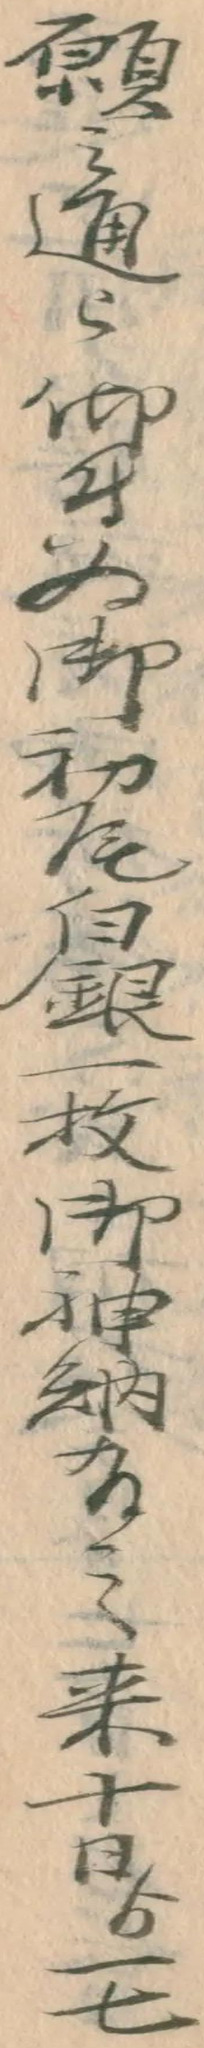願之通被仰付為御初尾白銀一枚御神納有之来十日ゟ一七
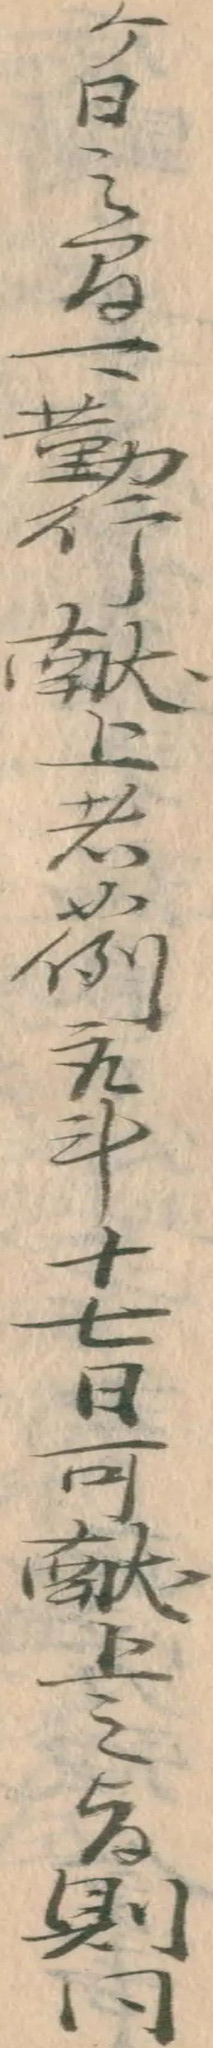ケ日之間可勤行献上者如例取斗十七日可献上之旨則同
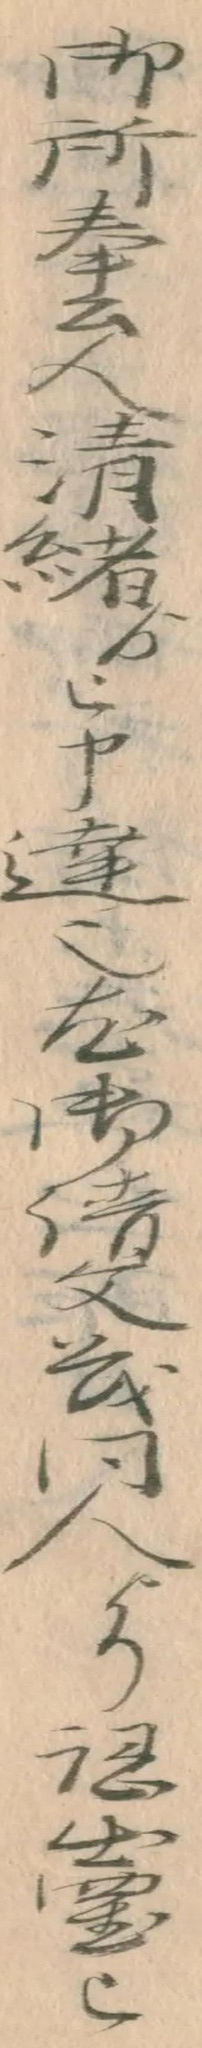御所奉公人清緒ゟ被申達也尤御請文も同人より認出置被
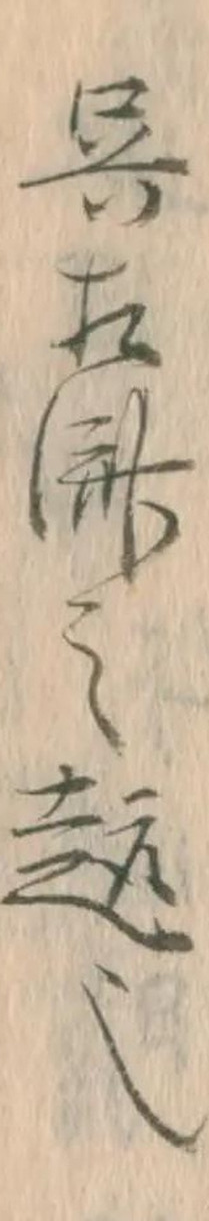呉相済之趣也
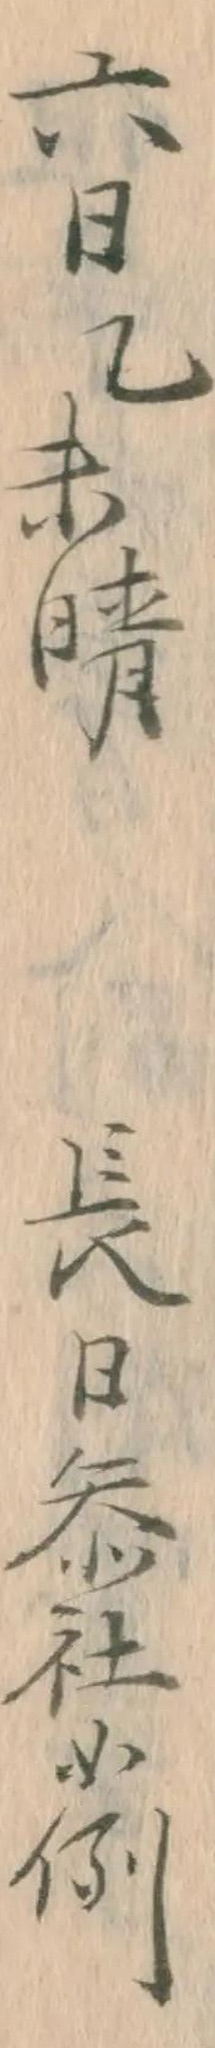六日乙未晴長日参社如例
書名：賀茂社記録. 第74冊
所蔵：国立国会図書館 National Diet Library, JAPAN
